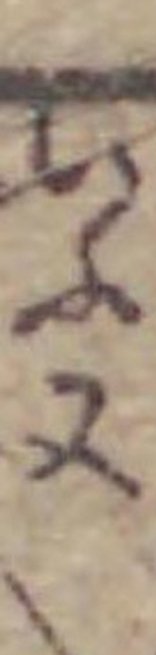いふ又
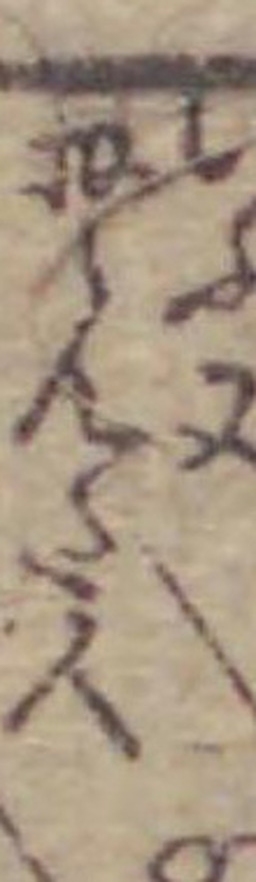おらんた人
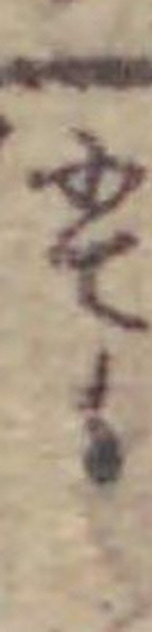にても
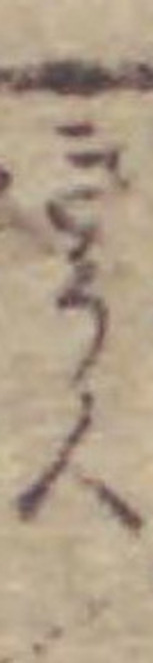きう人
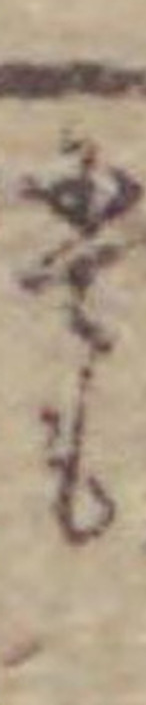にても
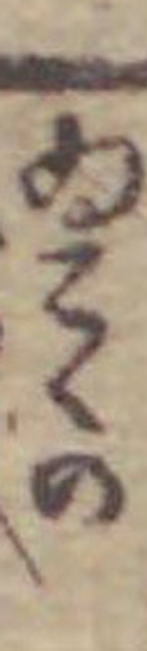ゐこくの

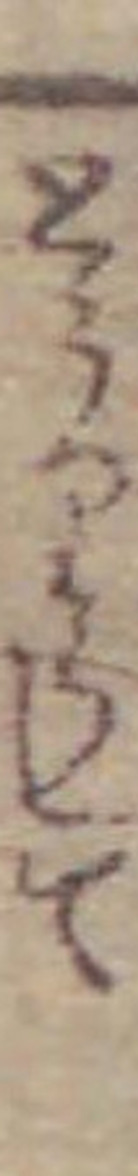とうりうして
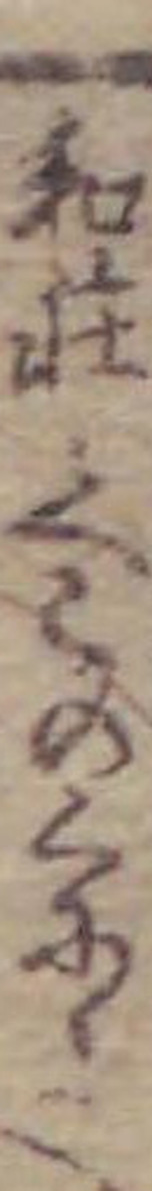和荘兵へこのくにゝ
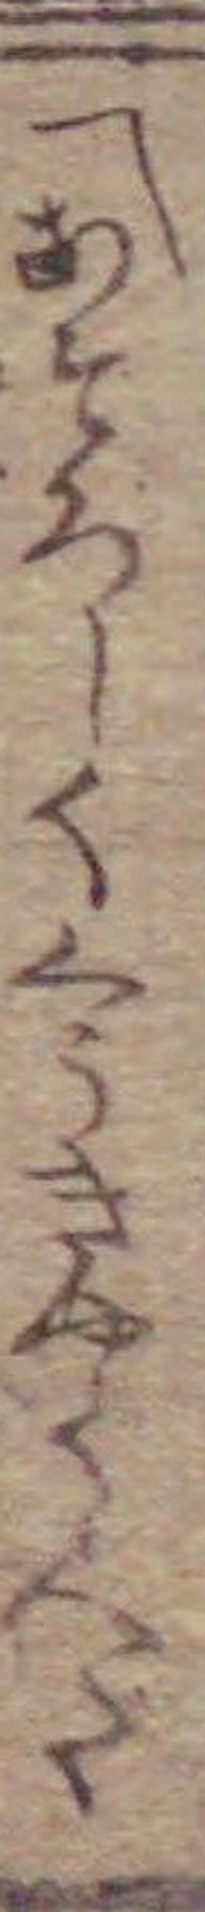〽おそろしくくうきやく人だ
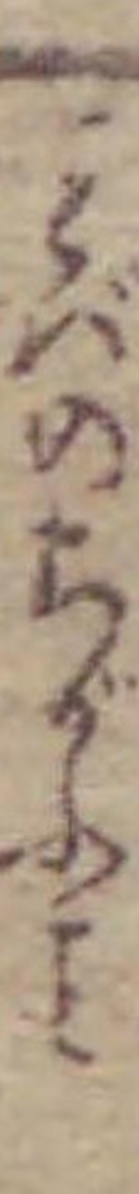ことばのちがふこと
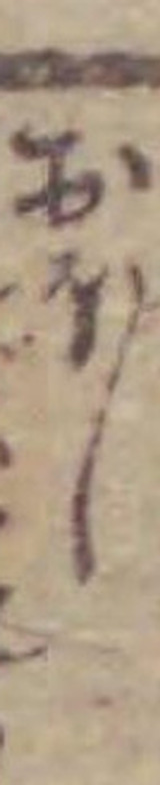おほし
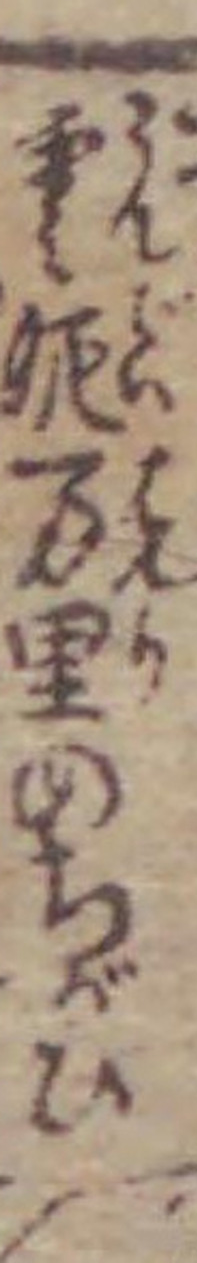雲泥万里のちがひ
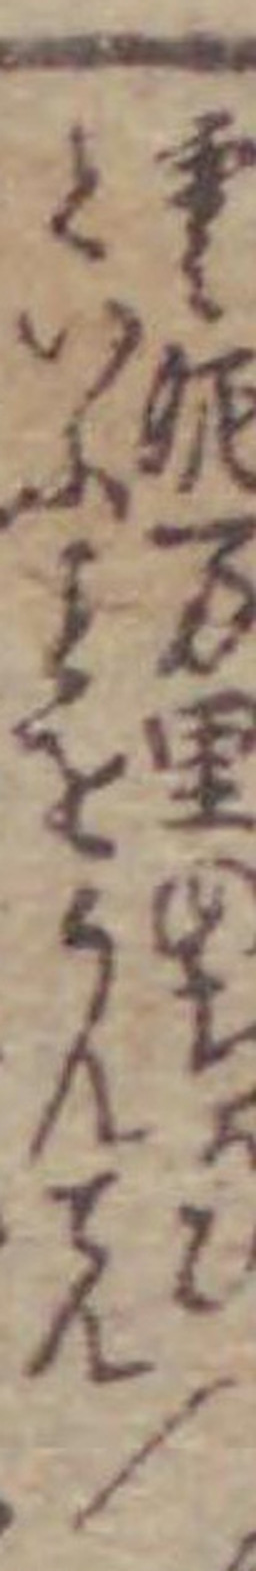といふことをかんてん
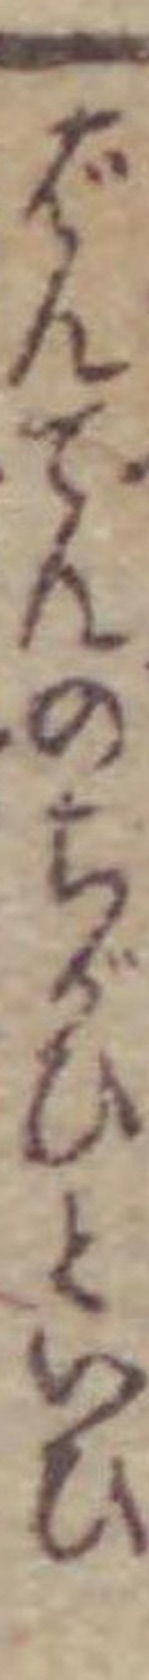ばんてんのちがひといひ
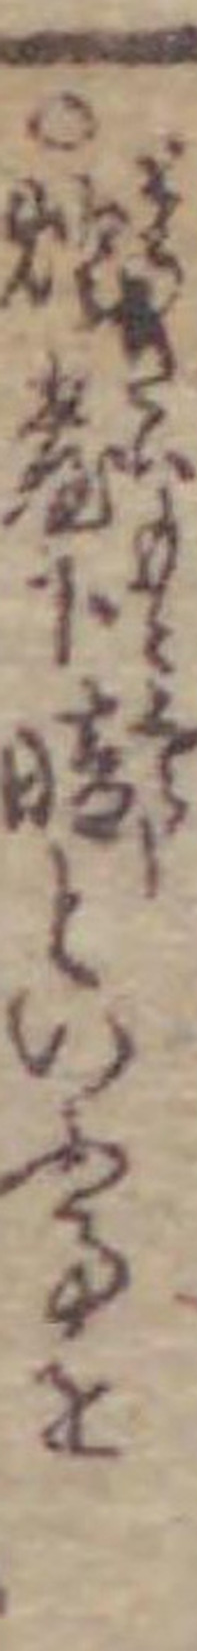○灯台下暗といふ事を
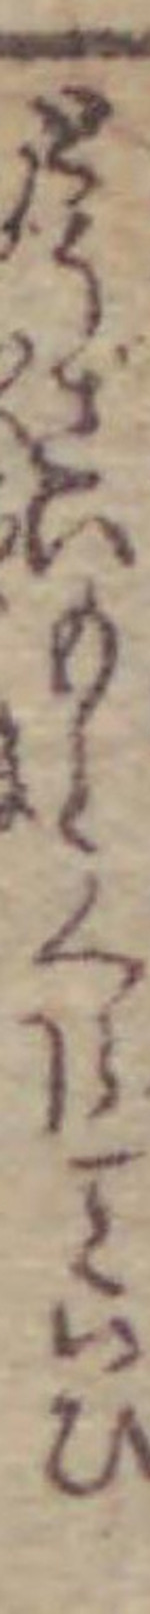とうざいもとくらしといひ
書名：和荘兵衛後日話 : 3巻
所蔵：国立国会図書館 National Diet Library, JAPAN
